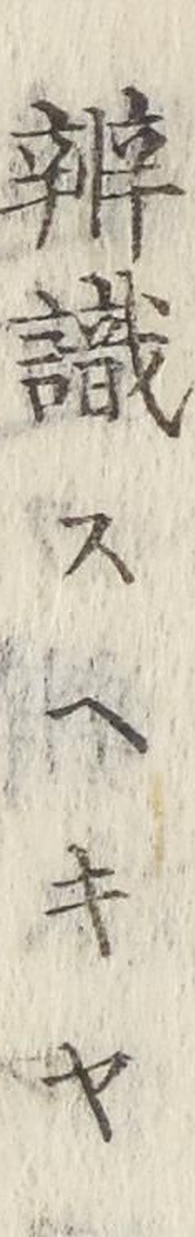弁識スヘキヤ
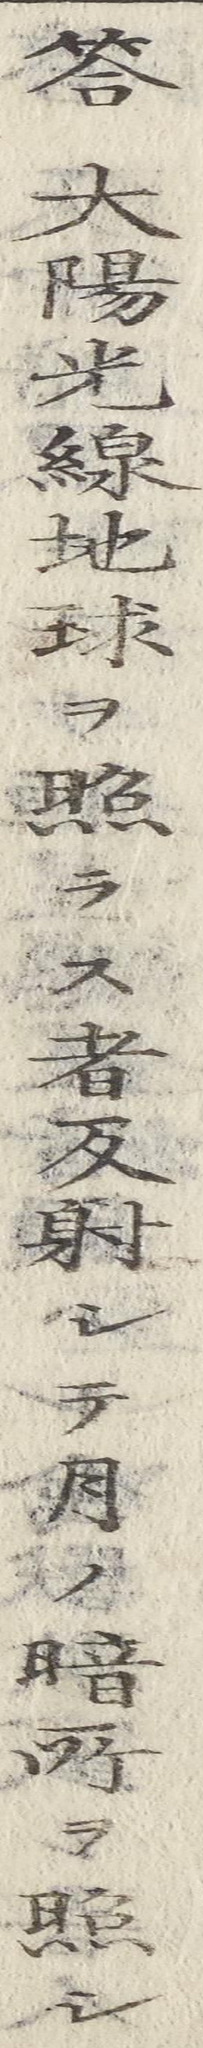答大陽光線地球ヲ照ラス者反射シテ月ノ暗所ヲ照シ
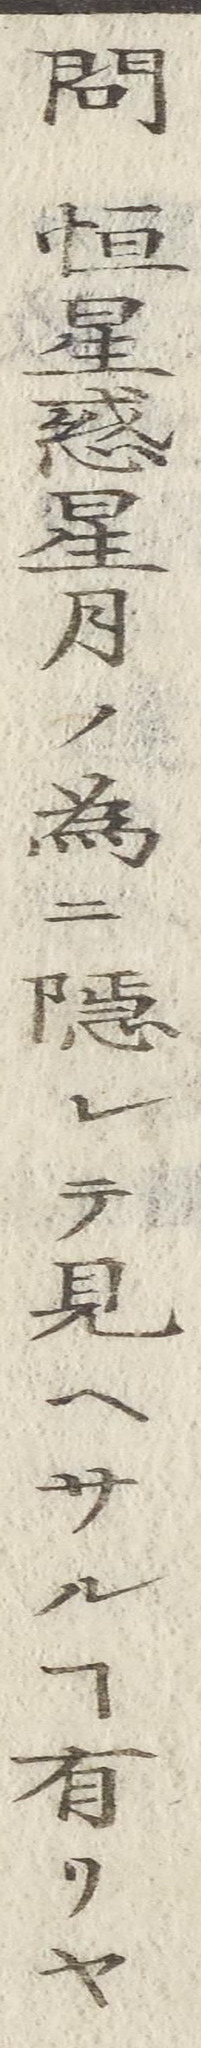問恒星惑星月ノ為ニ隠レテ見ヘサルコト有リヤ
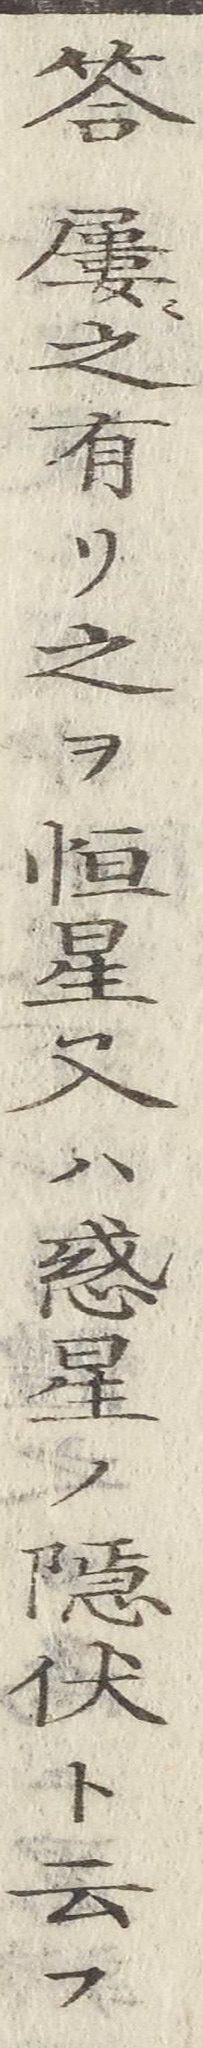答屢〱之有リ之ヲ恒星又ハ惑星ノ隠伏ト云フ
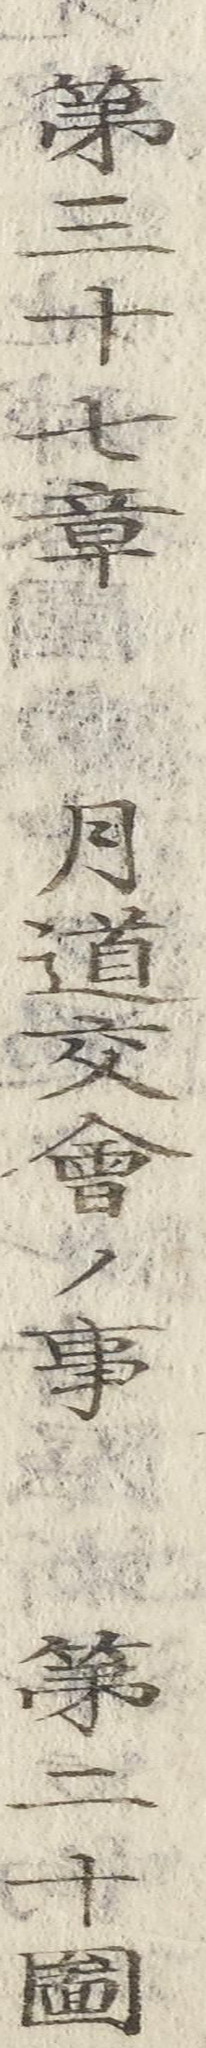第三十七章月道交会ノ事第二十図
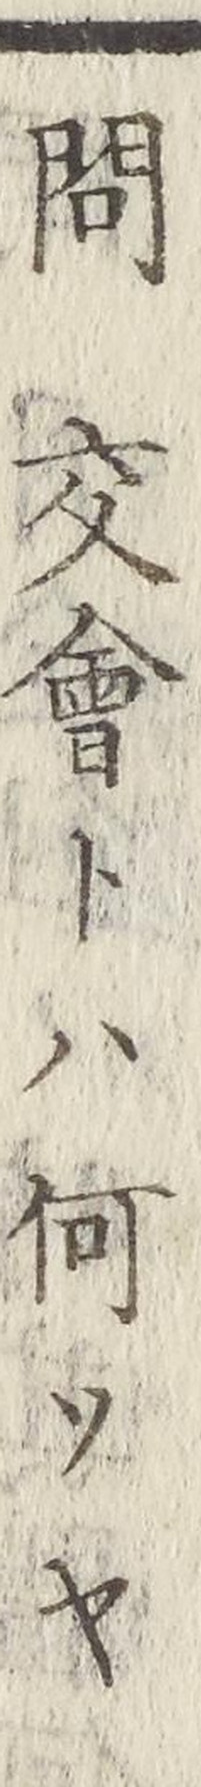問交会トハ何ソヤ
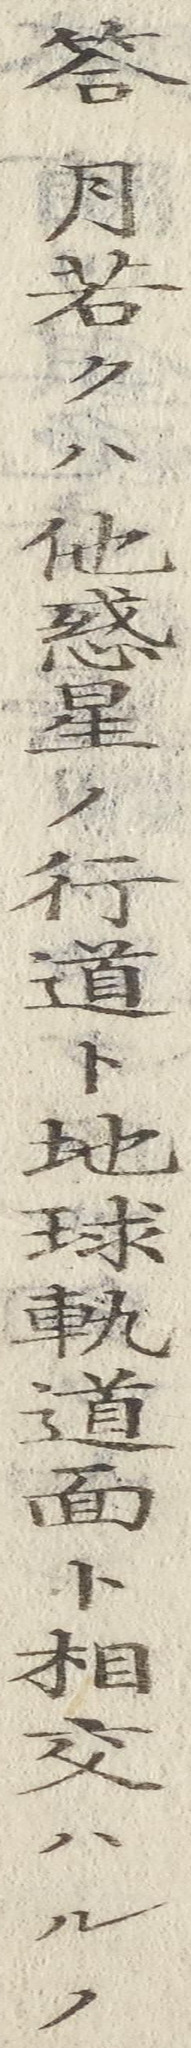答月若クハ他惑星ノ行道ト地球軌道面ト相交ハルノ
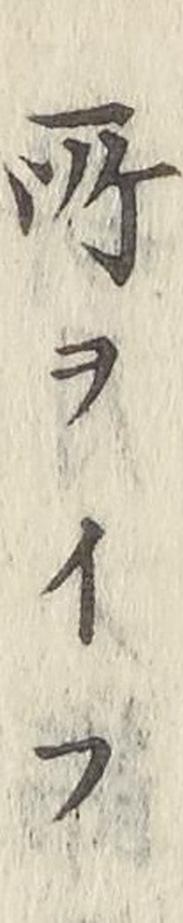所ヲイフ
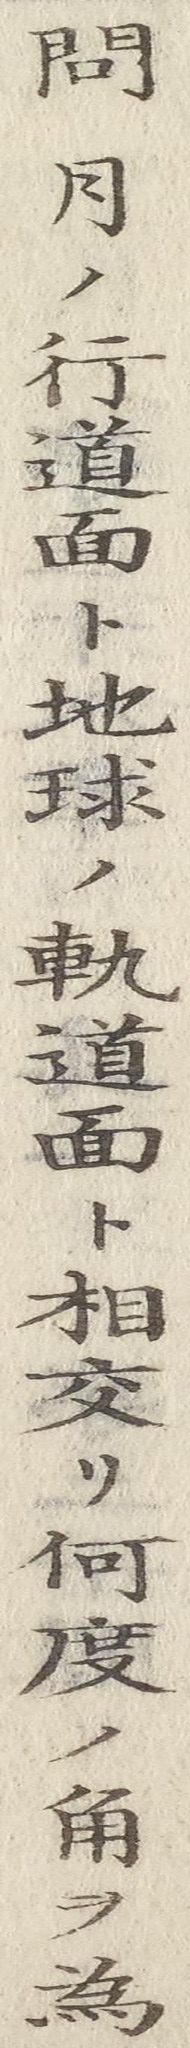問月ノ行道面ト地球ノ軌道面ト相交リ何度ノ角ヲ為
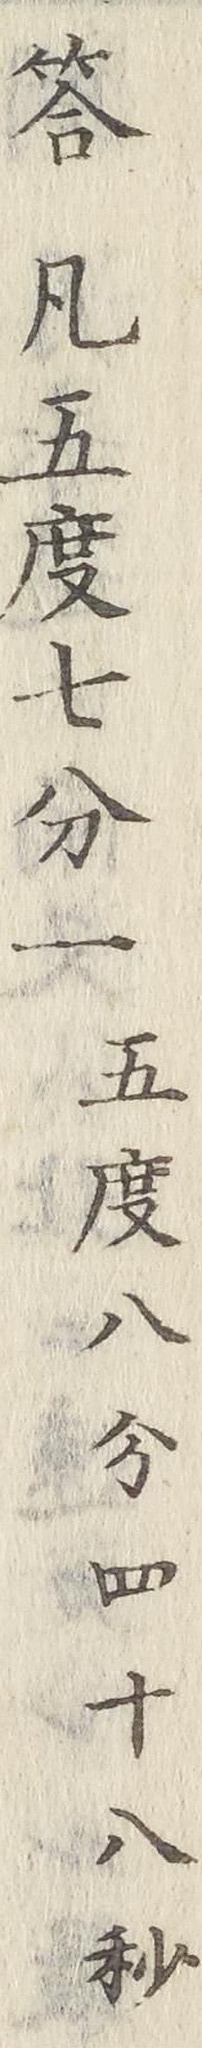答凡五度七分一五度八分四十八秒
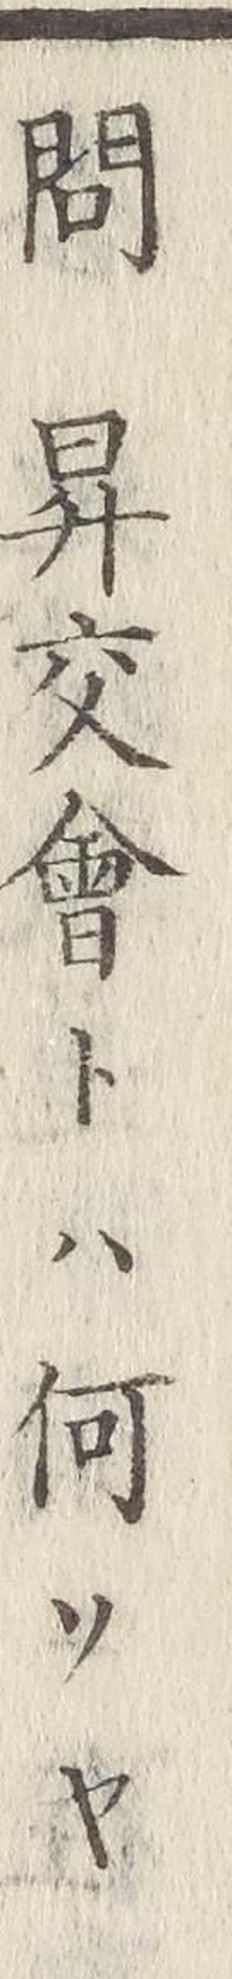問昇交会トハ何ソヤ
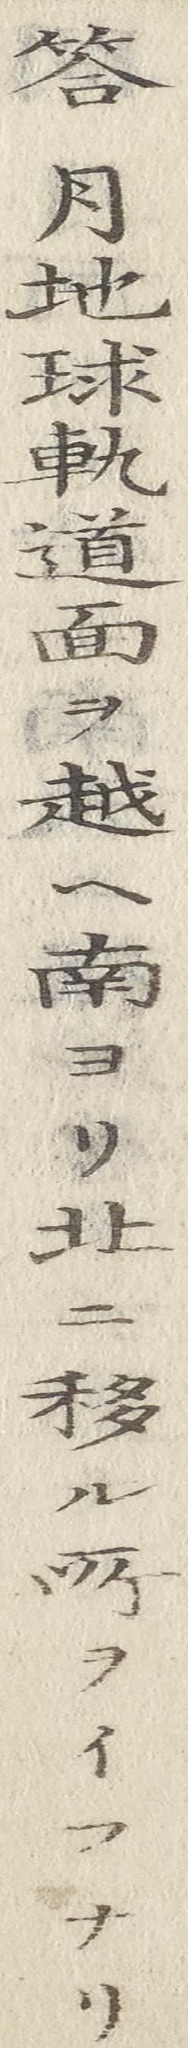答月地球軌道面ヲ越ヘ南ヨリ北ニ移ル所ヲイフナリ
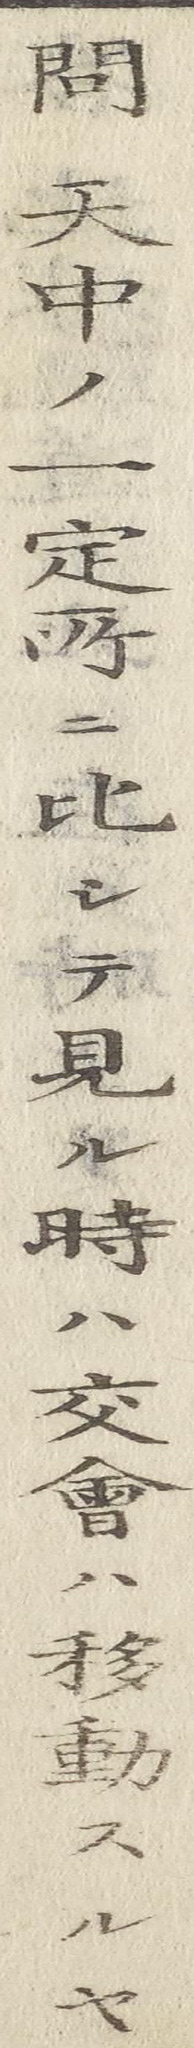問天中ノ一定所ニ比シテ見ル時ハ交会ハ移動スルヤ
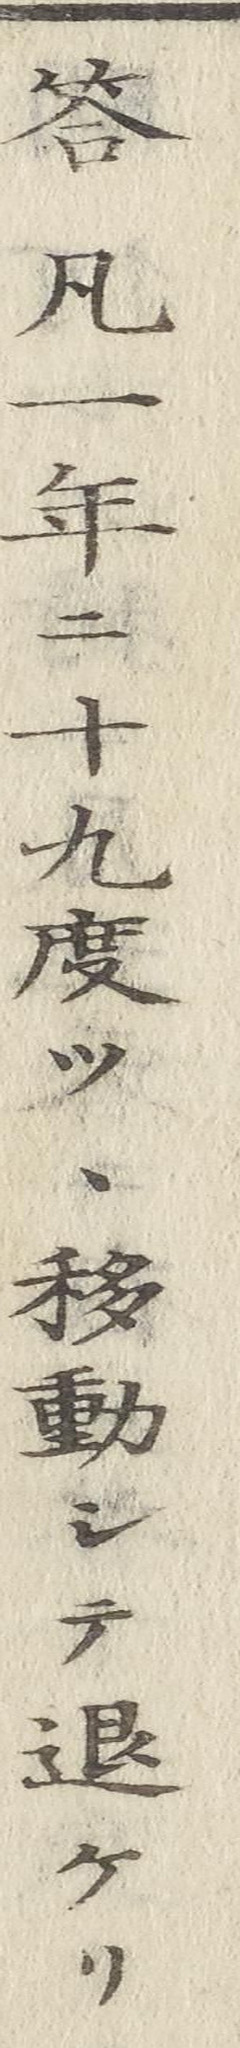答凡一年二十九度ツヽ移動シテ退ケリ

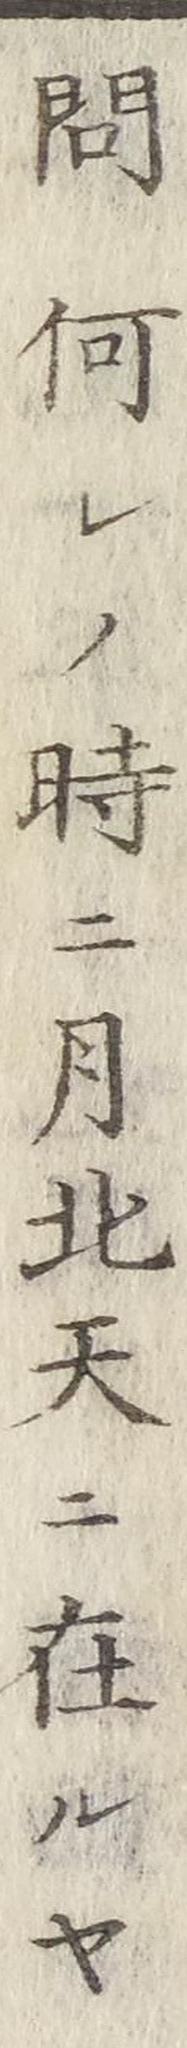問何レノ時ニ月北天ニ在ルヤ
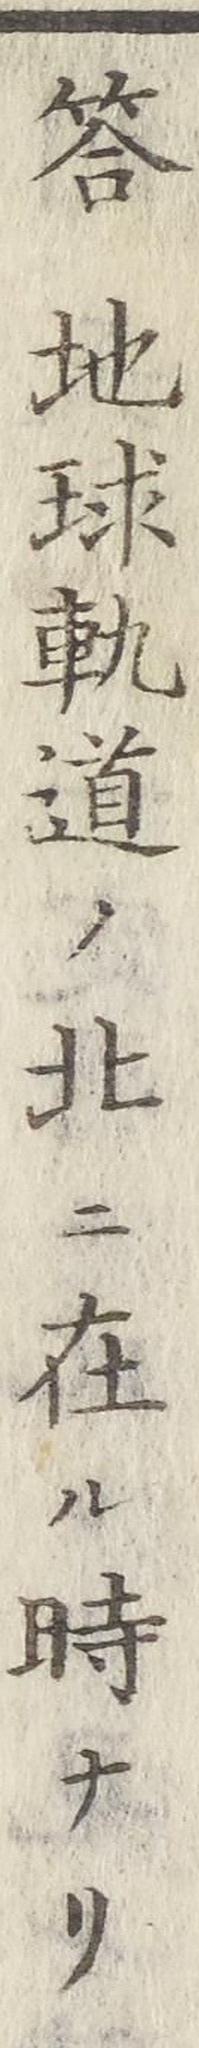答地球軌道ノ北ニ在ル時ナリ
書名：星学圖説　下
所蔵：東京大学地震研究所図書室 Earthquake Research Institute Library, The University of Tokyo, JAPAN
